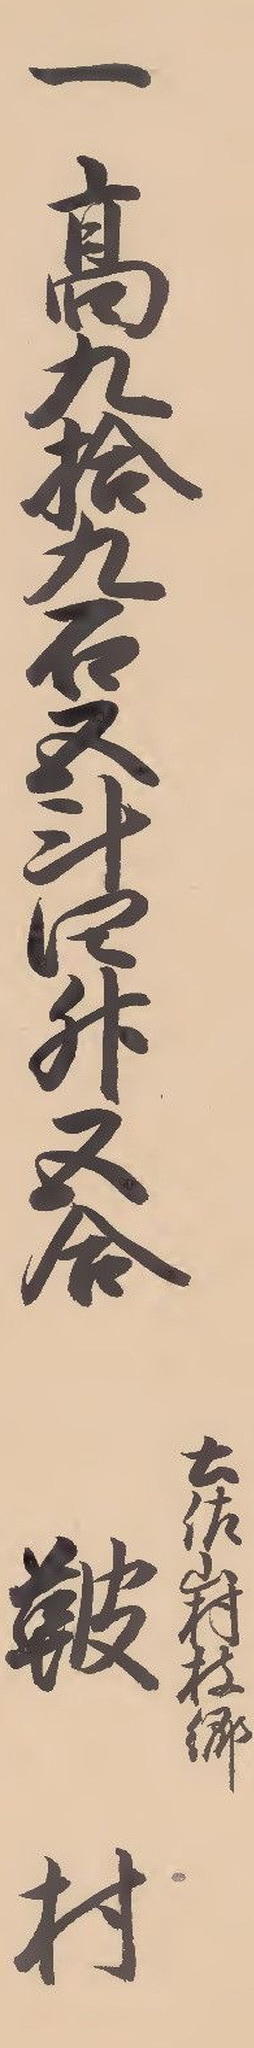一髙九拾九石五斗四升五合村
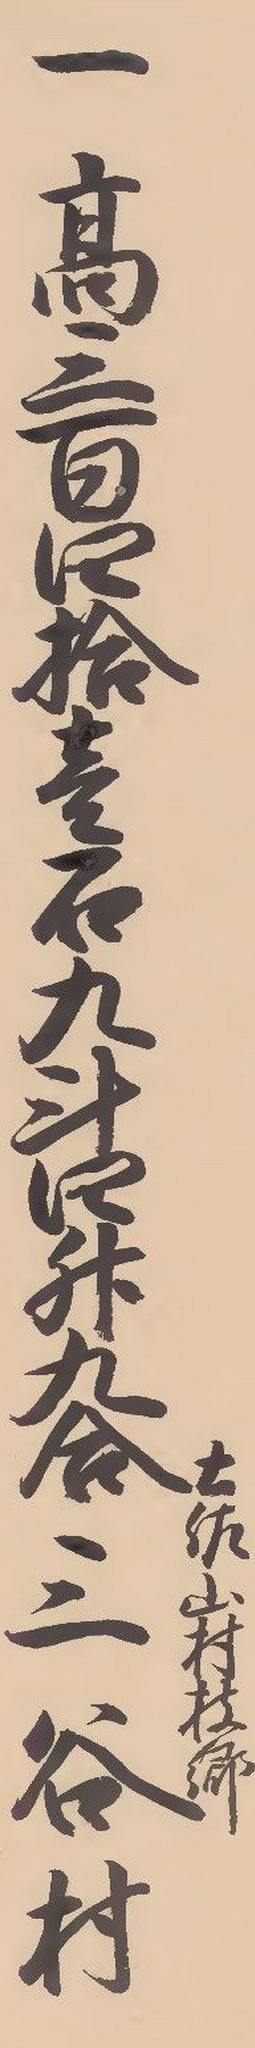一髙三百四拾壱石九斗四升九合三谷村

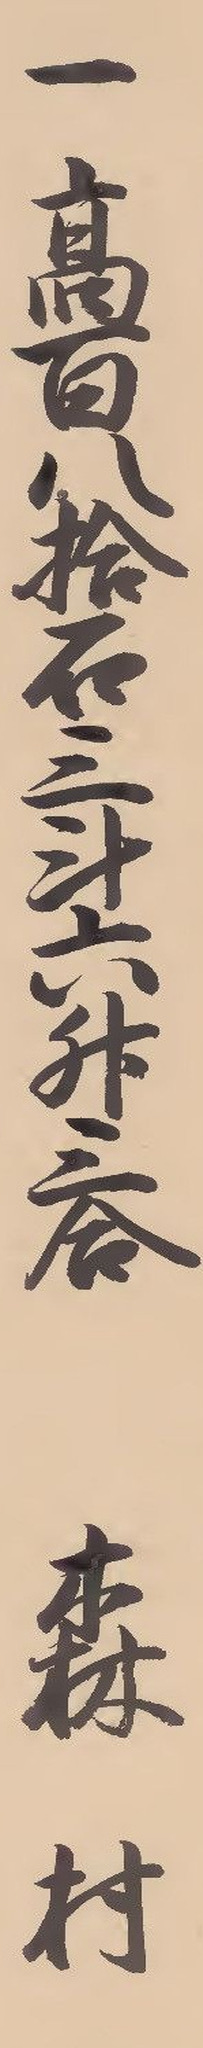一髙百八拾石三斗六升三合森村
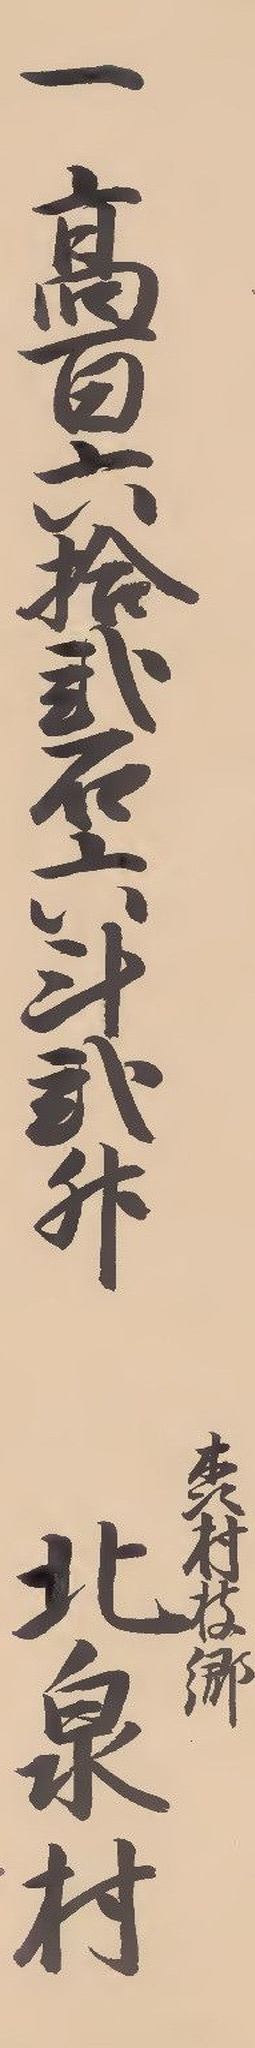一髙百六拾弐石六斗弐升北泉村
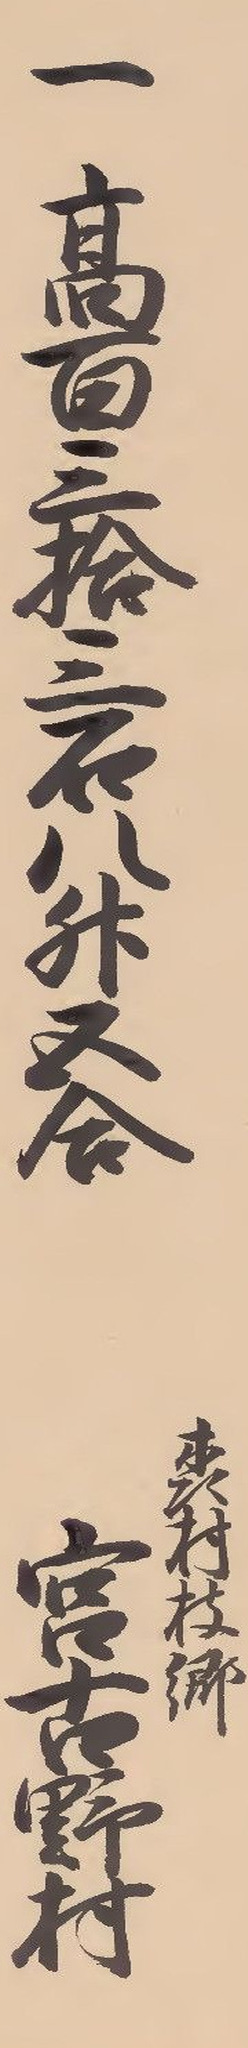一髙百三拾三石八斗五合宮古野村
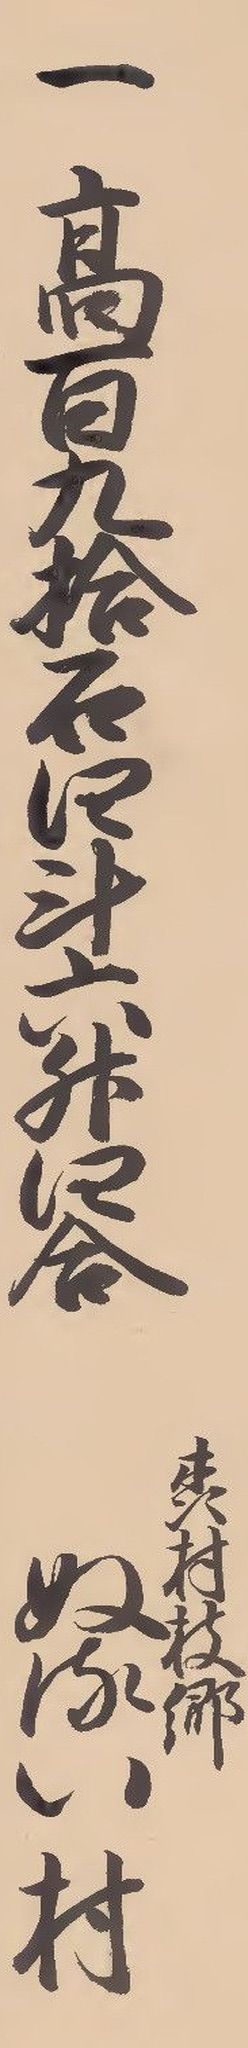一髙百九拾石四斗六升四合ぬるい村
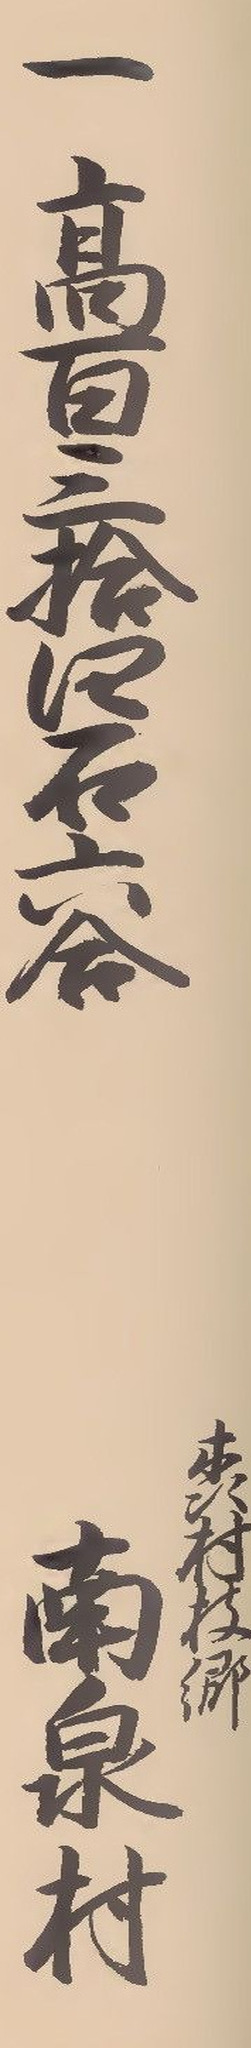一髙百三拾四石六合南泉村
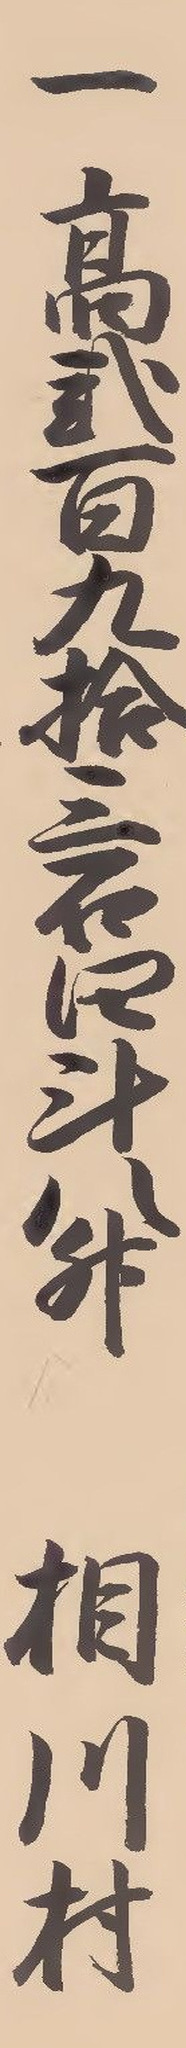一髙弐百九拾三石四斗八升相川村
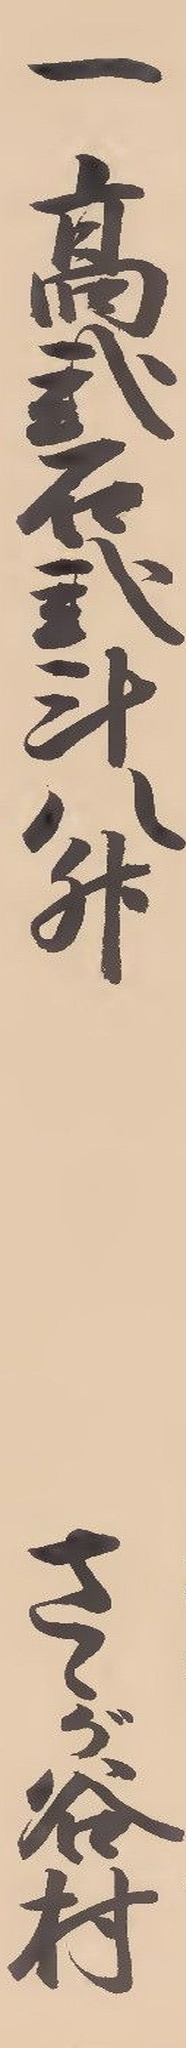一髙弐石弐斗八升ささが谷村
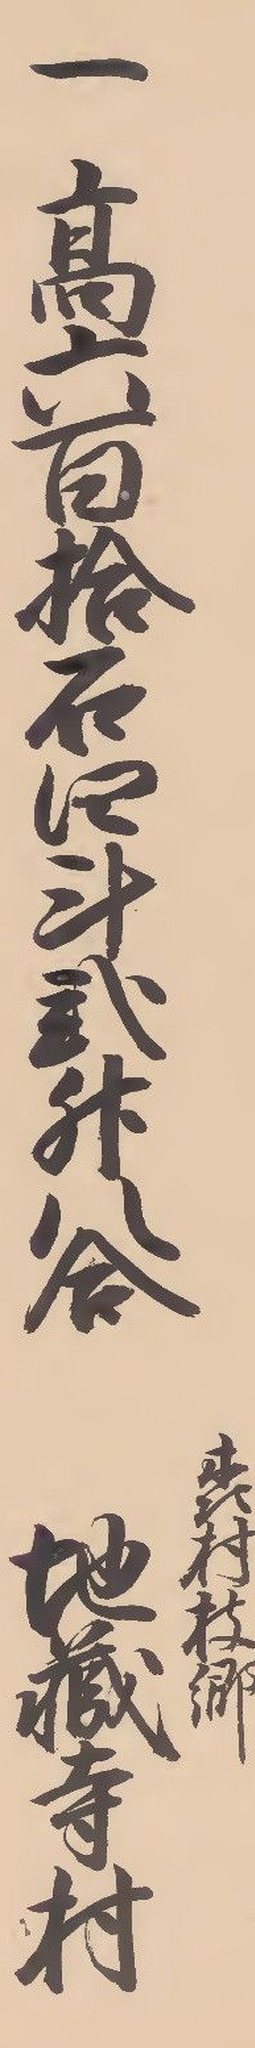一髙六百拾石四斗弐升八合地藏寺村

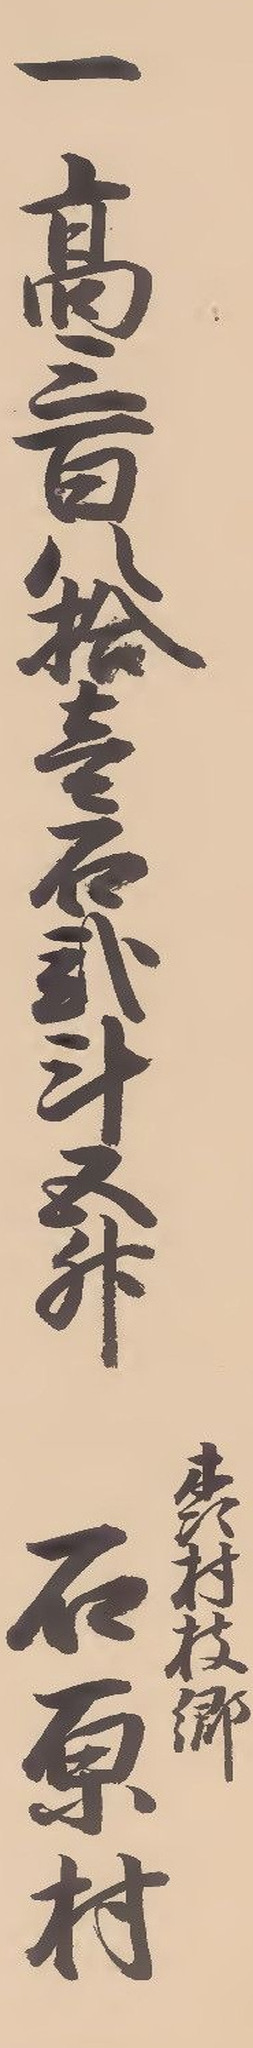一髙三百八拾壱石弐斗五升石原村
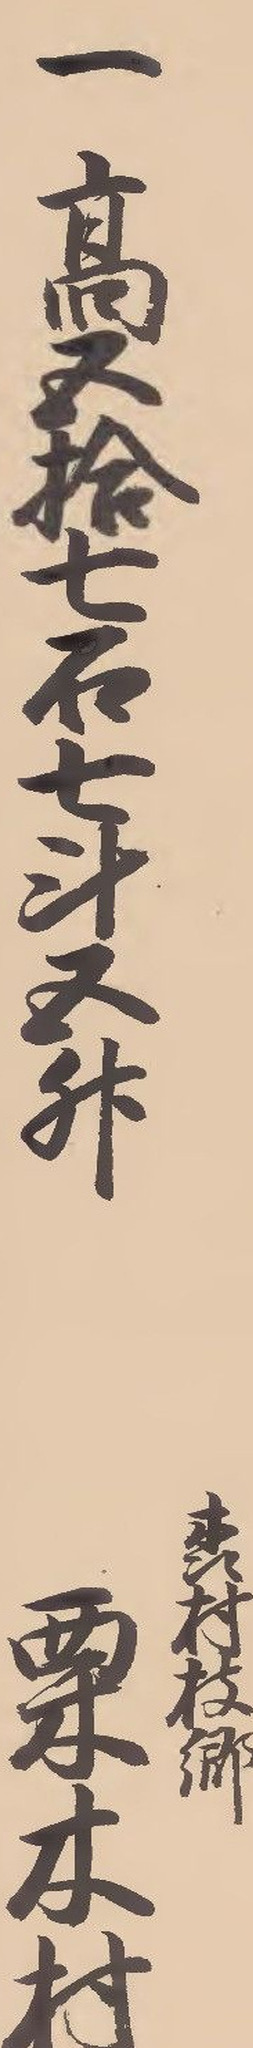一髙五拾七石七斗五升栗木村
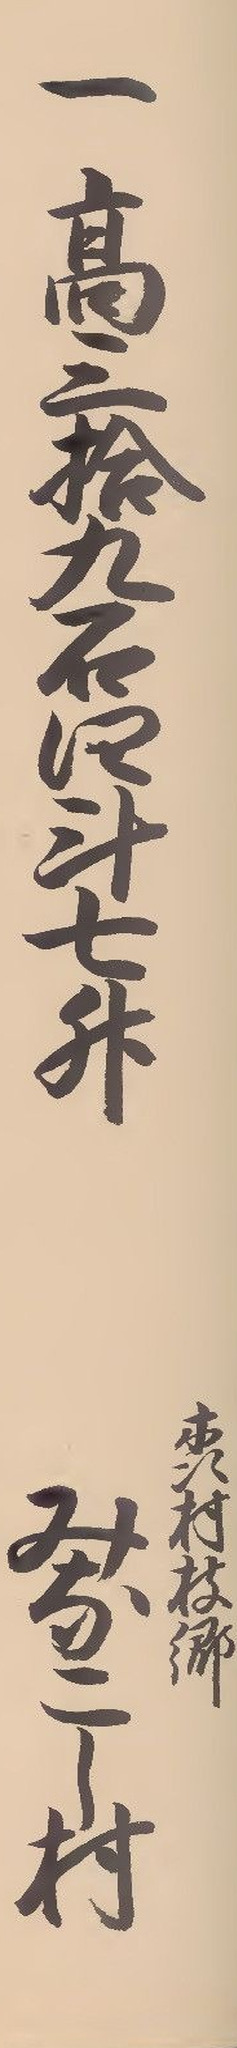一髙三拾九石四斗七升みなこし村
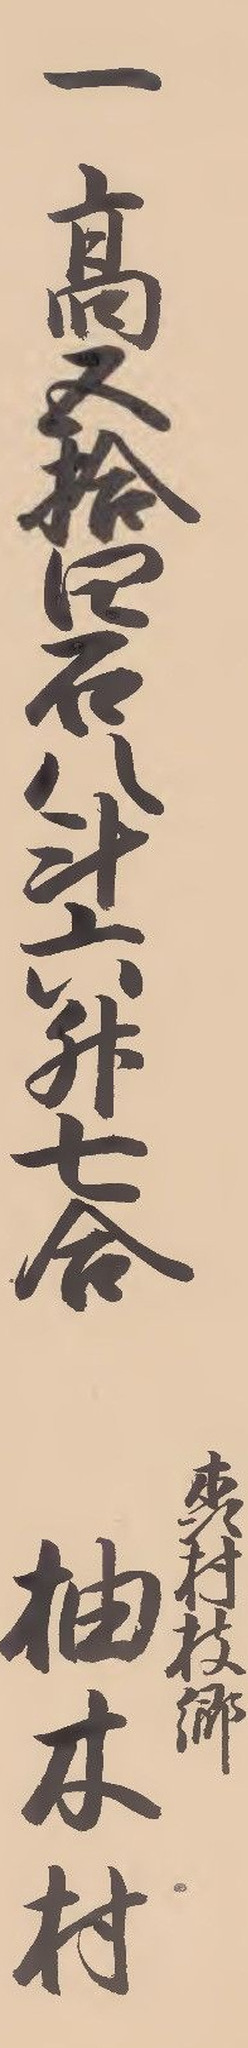一髙五拾四石八斗六升七合柚木村
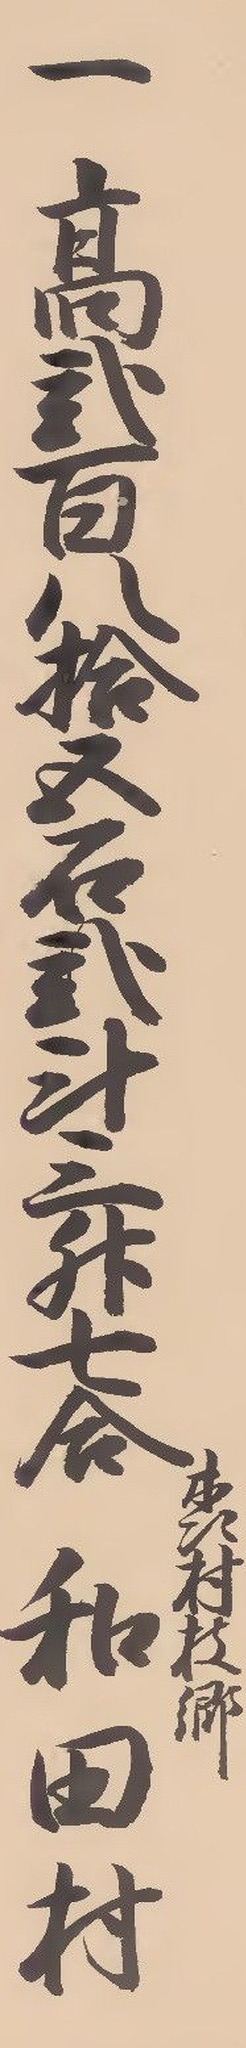一髙弐百八拾五石弐斗三升七合和田村

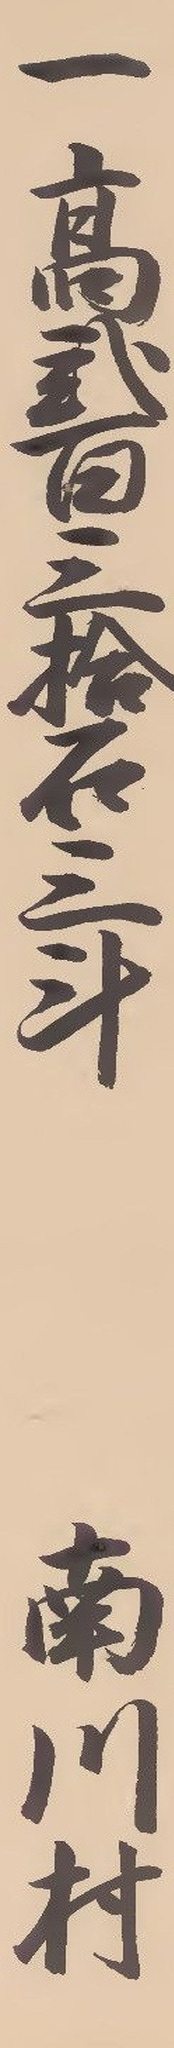一髙弐百三拾石三斗南川村
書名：土佐国郷帳
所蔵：国立公文書館 National Archives of Japan
